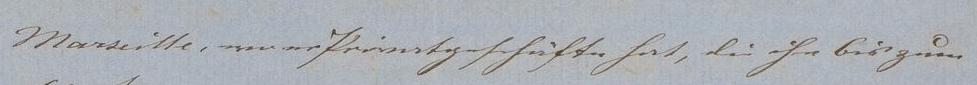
Marseille, wo er Privatgeschäfte hat, die ihn bis zum
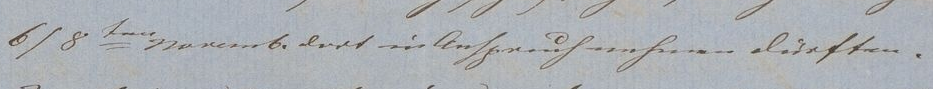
6/8ten Novemb. dort in Anspruch nehmen dürften.
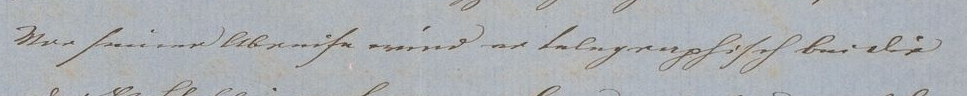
Vor seiner Abreise wirder telegraphisch bei Dir
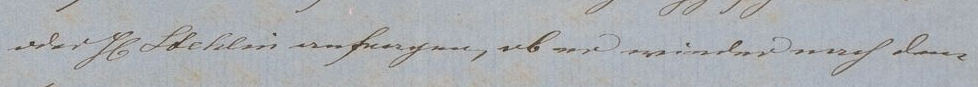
oder H Stehlin anfragen, ob er wieder nach dem
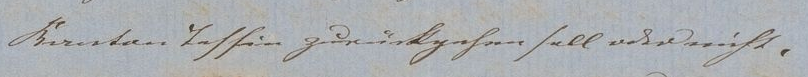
Kanton Tessin zurückgehen soll oder nicht.
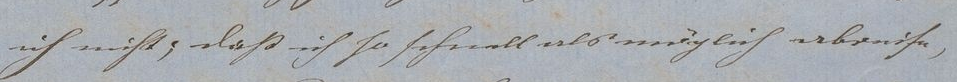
ich nicht; daß ich soschnell als möglich abreise,
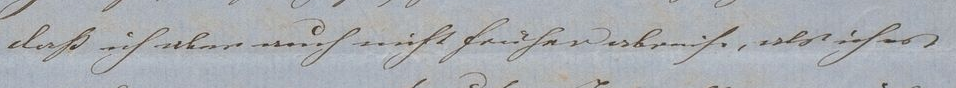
daß ich aber auch nicht früher abreise, als ich es
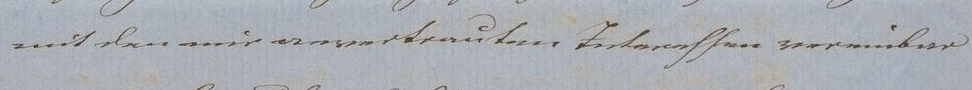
mit den mir anvertrauten Interessen vereinbar
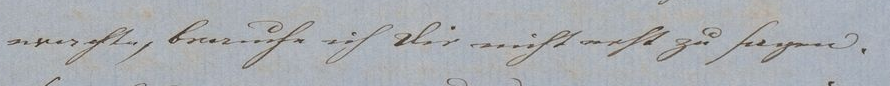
erachte, brauche ich Dir nicht erst zu sagen.
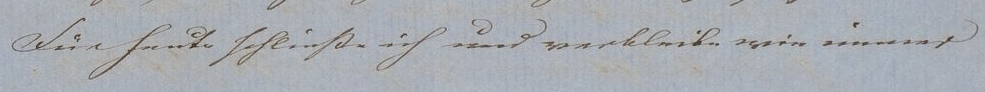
Für heute schließe ich und verbleibe wie immer
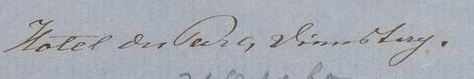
Hotel du Parc, Dienstag.
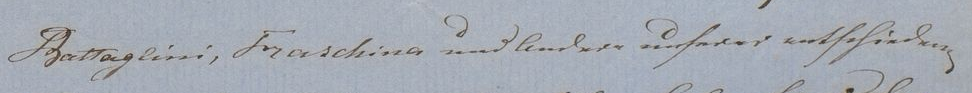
Battaglini, Fraschina und Andere unserer entschiedenen
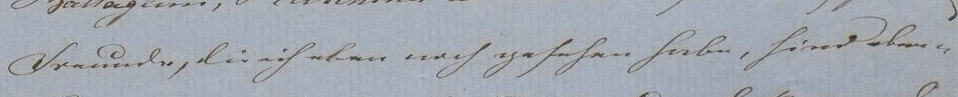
Freunde, die ich eben noch gesehen habe, sind eben-
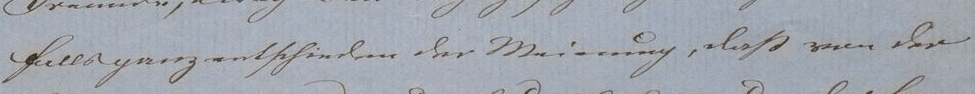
falls ganz entschieden der Meinung, daß von der
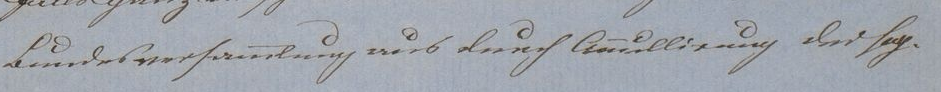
Bundesversammlung aus durch Annullirung der sog.
